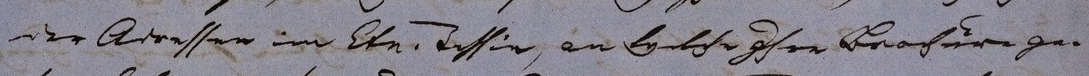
der Adressen im Ctn. Tessin, an welche Ihre Brochüre ge-
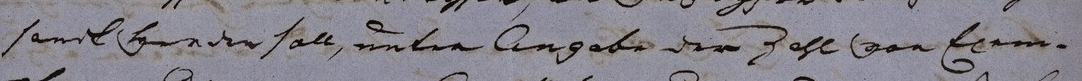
sandt werden soll, unter Angabe der Zahl von Exem-
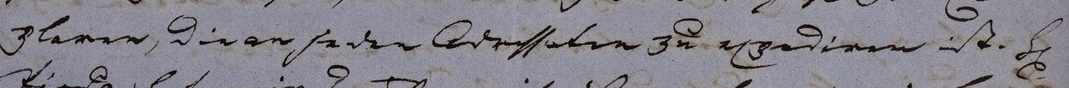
plaren, die an jeden Adressaten zu expediren ist. Herr
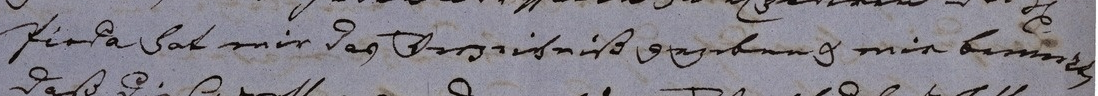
Pioda hat mir das Verzeichniß gegeben & mir bemerkt,
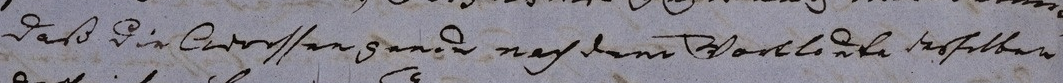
daß die Adressen genau nach dem Wortlaute desselben
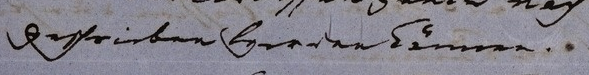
geschrieben werden können.
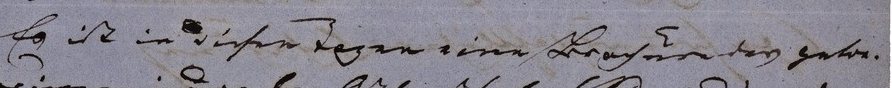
Es ist in diesen Tagen eine Brochüre des gewe-
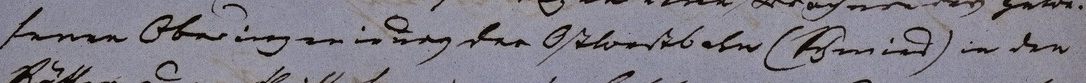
senen Oberingenieurs der Ostwestbahn (Schmied) in den
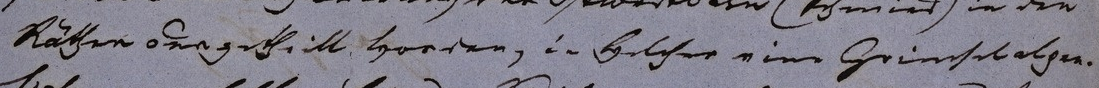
Räthen ausgetheilt worden, in welcher eine Grimselalpen-
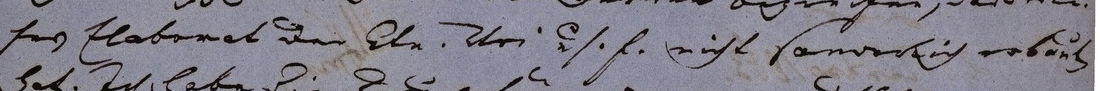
ses Elaborat den Ctn. Uri us. f. nicht sonderlich erbaut
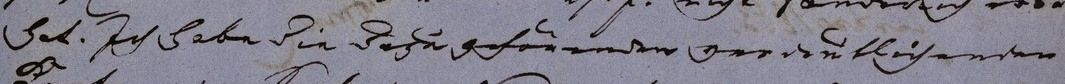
hat. Ich habe die dazu gehörenden verdeutlichenden
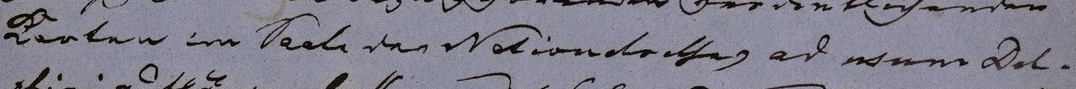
Karten im Saale des Nationalrathes ad usum Del -
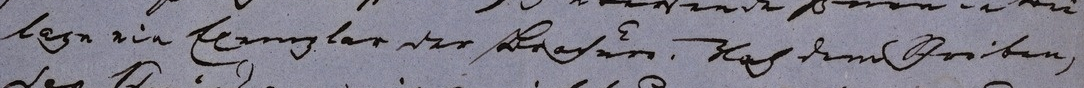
lage ein Exemplar der Brochüre. Nach dem Schreiben,
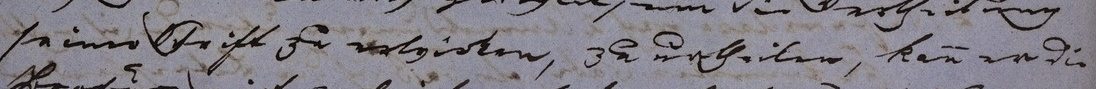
seiner Schrift zu erwirken, zu urtheilen, kann er die
